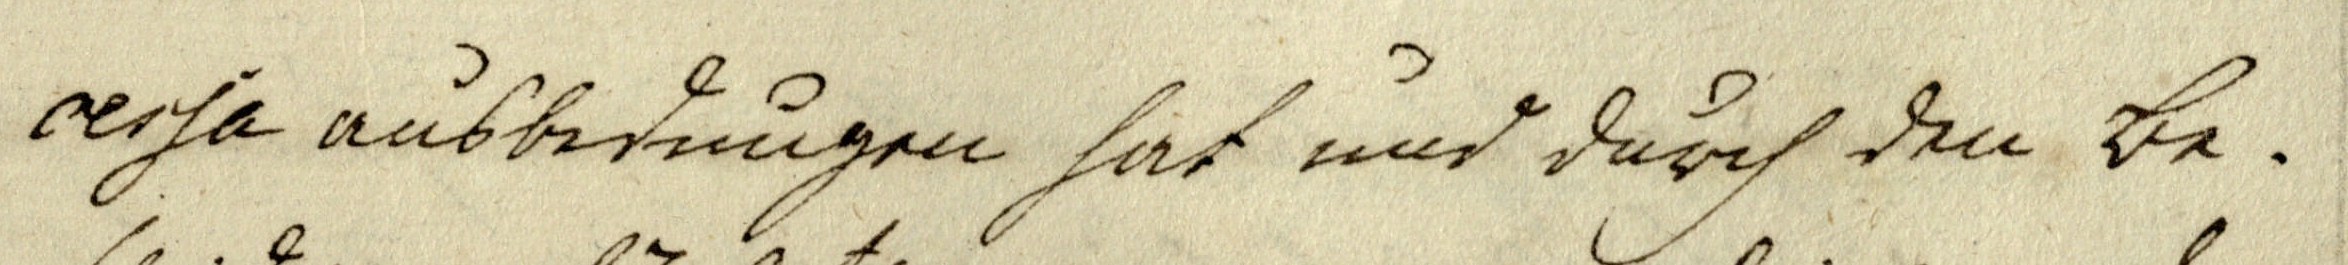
cessa ausbedungen hat und durch den Be¬
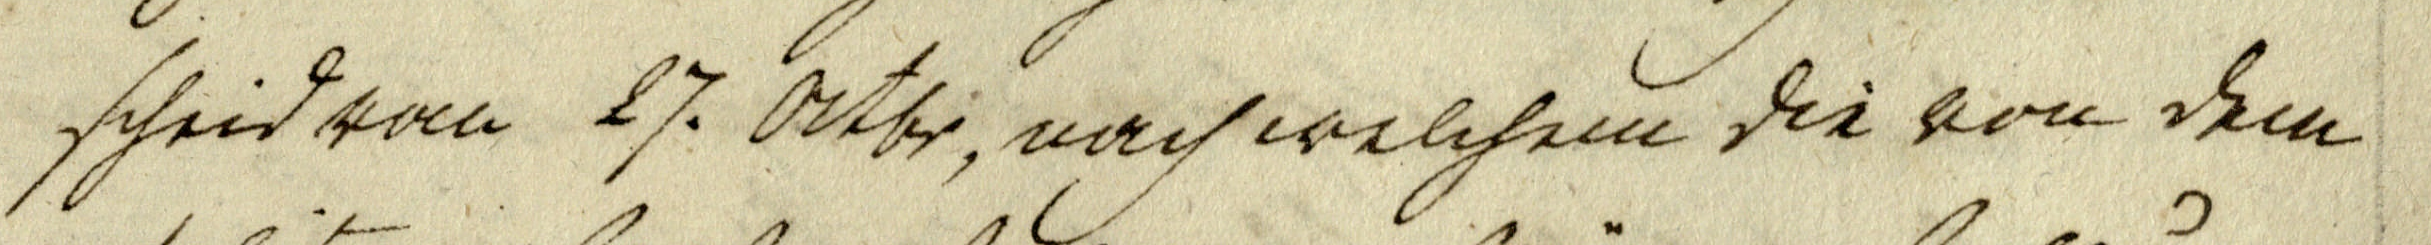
scheid von 27. Octbr, nach welchem die von dem
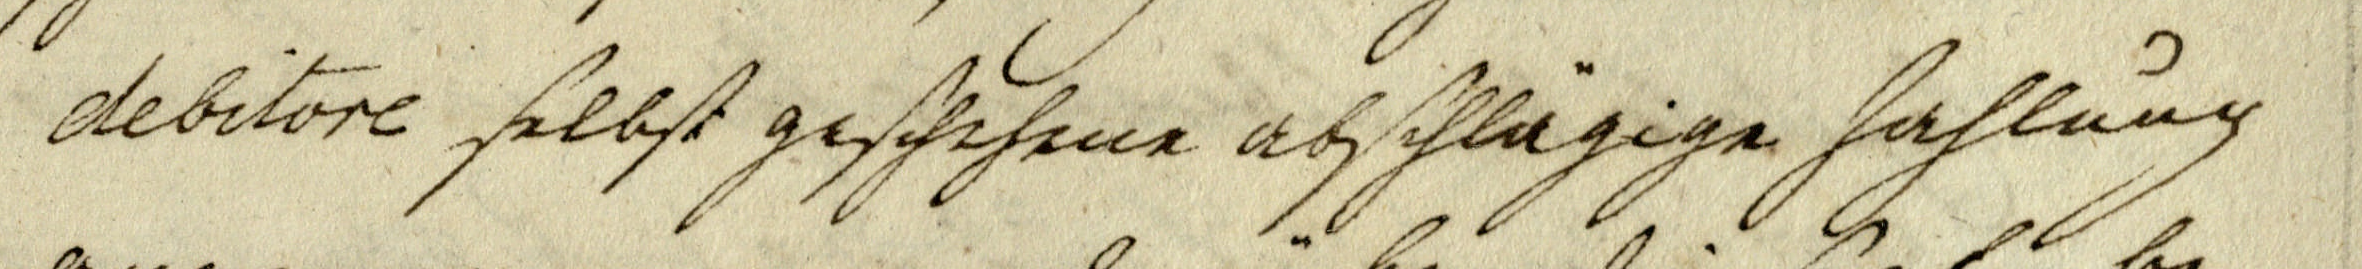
debitore selbst geschehene abschlägige Zahlung
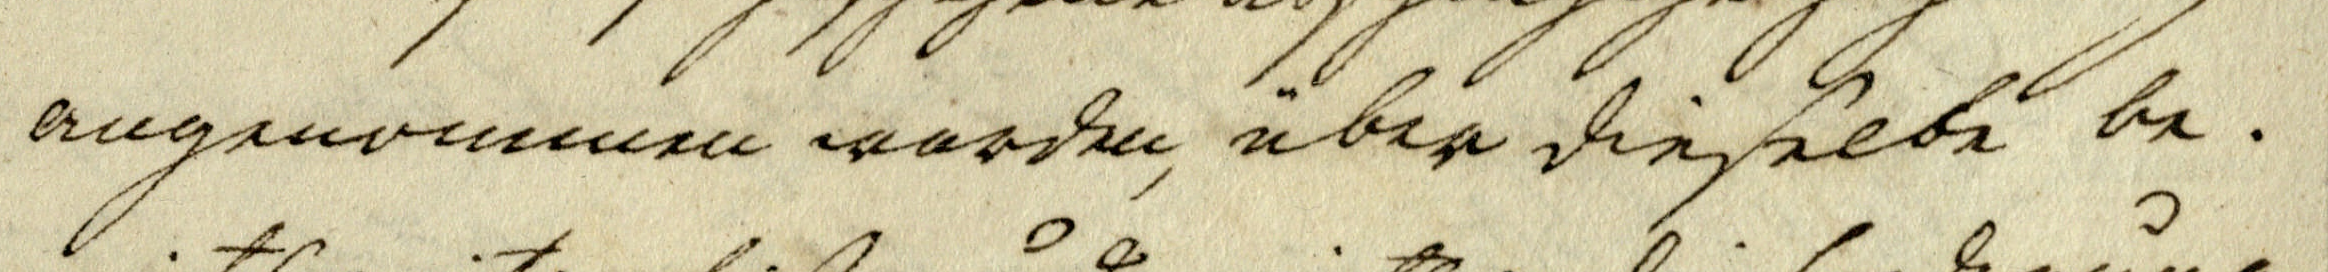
angenommen worden, über dieselbe be¬
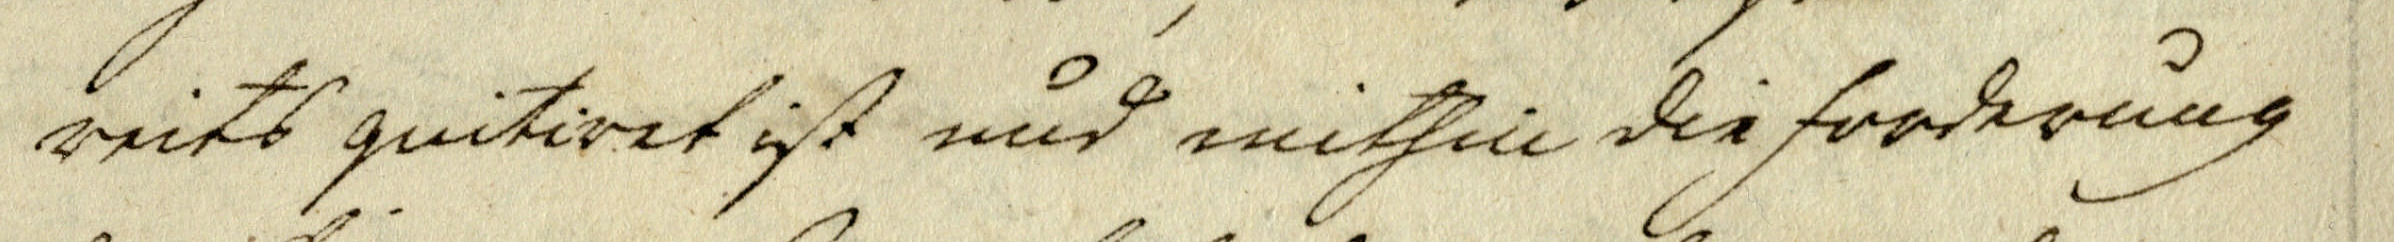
reits quitiret ist und mithin die Forderung
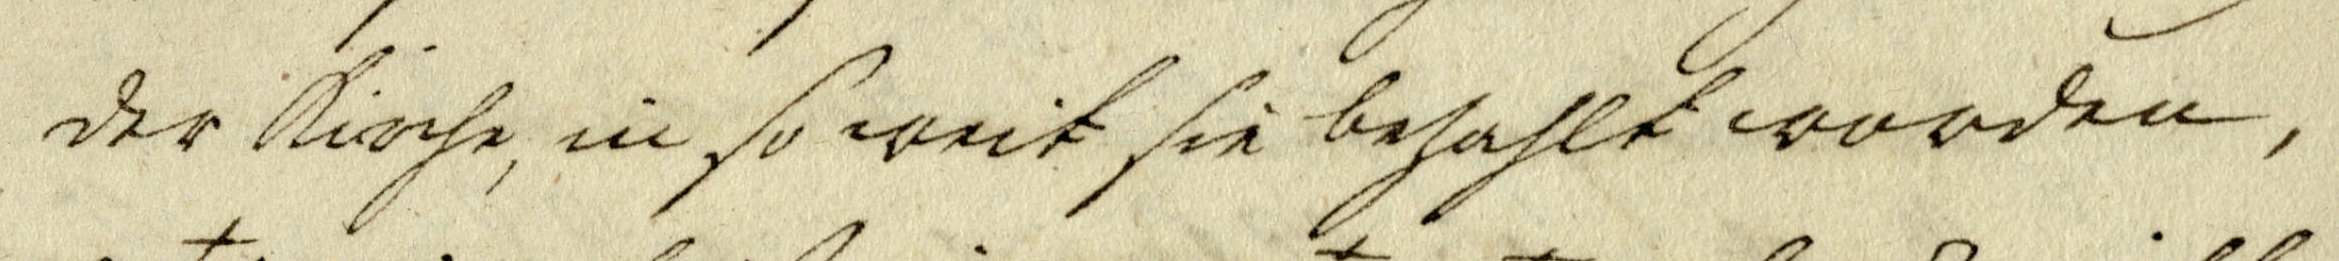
der Kirche, in so weit sie bezahlt worden,
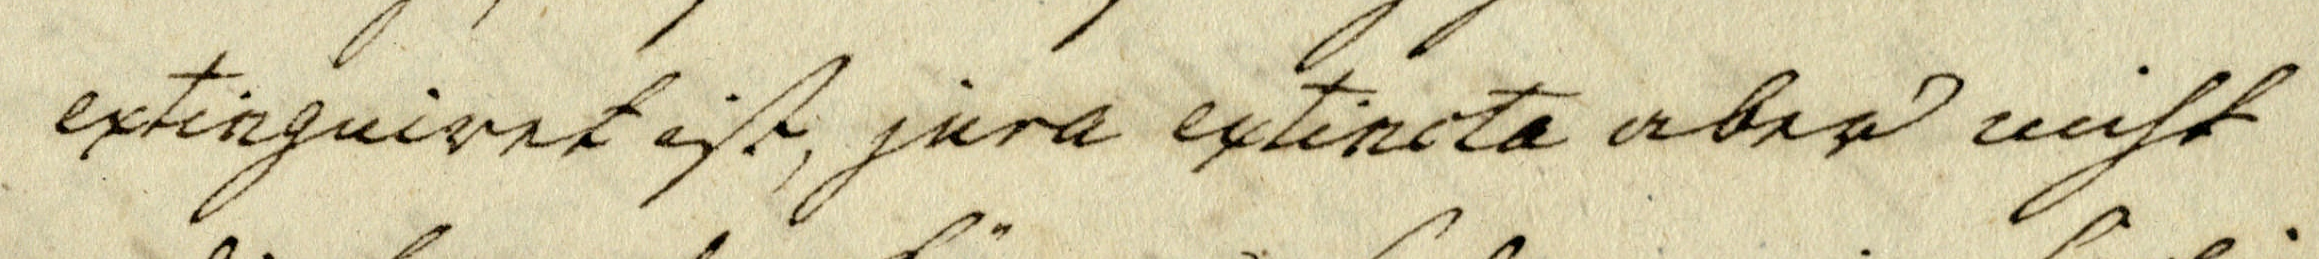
extinguiret ist, jura extincta aber nicht
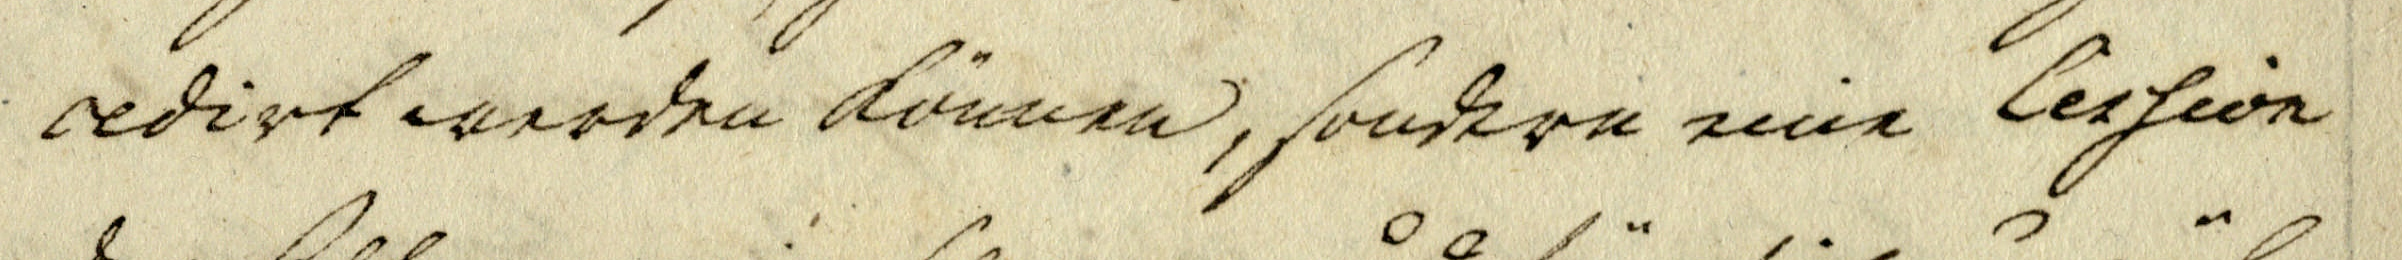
cedirt werden können, sondern eine Cession
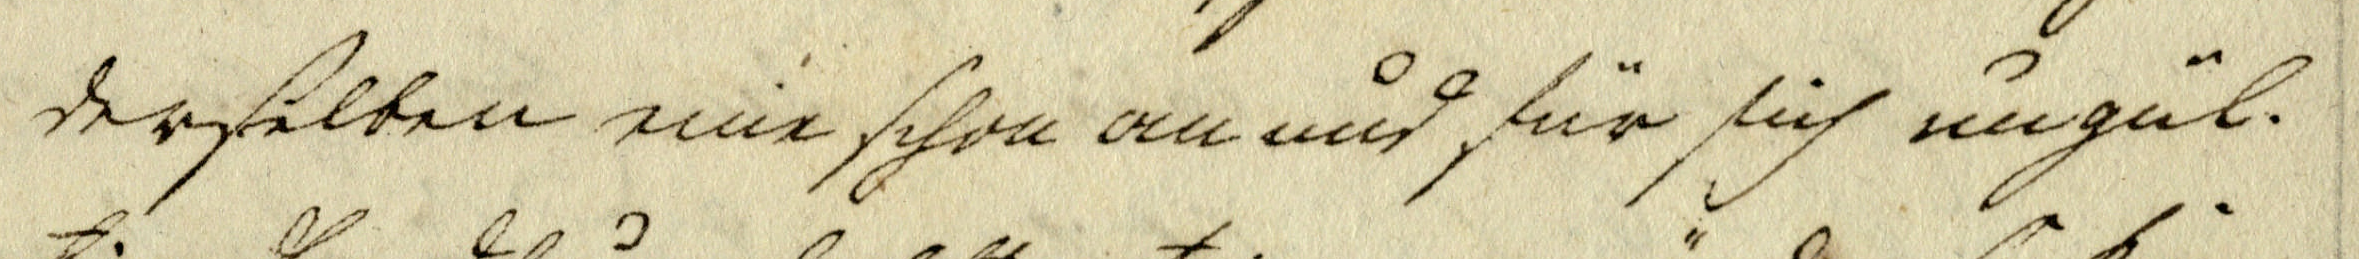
derselben eine schon an und für sich ungül¬
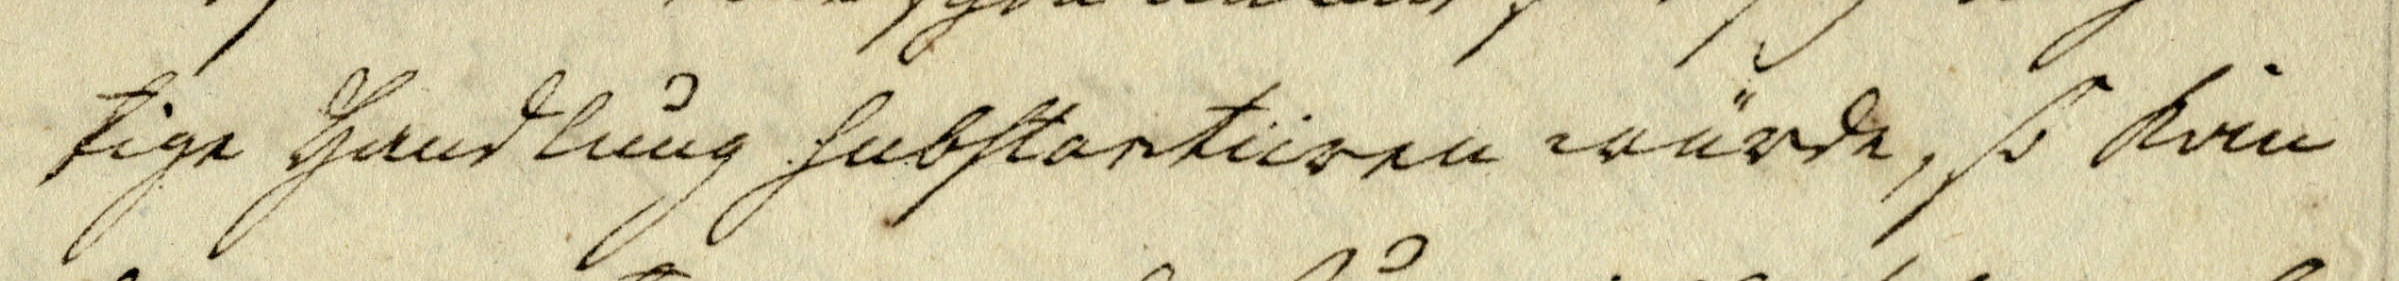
tige Handlung substantiren würde, so kan
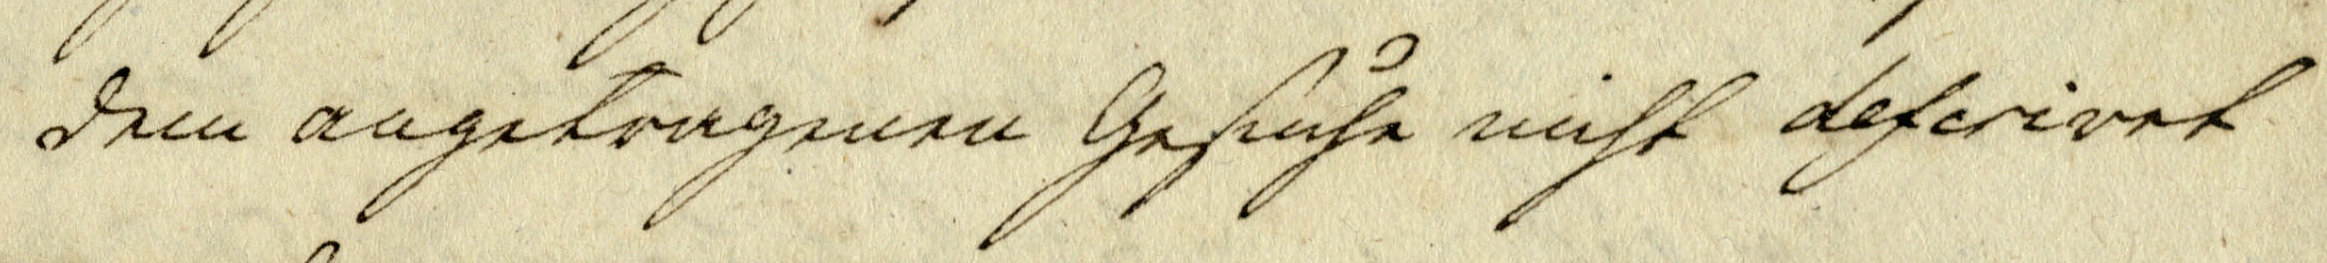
dem angetragenen Gesuche nicht deferiret
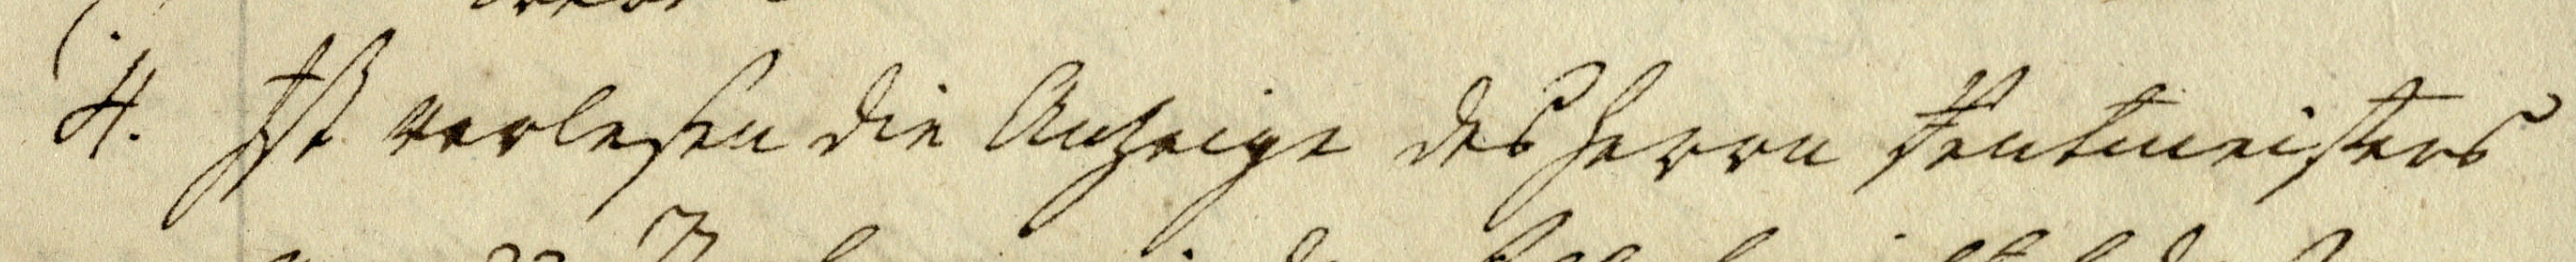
4. Ist verlesen die Anzeige des Herrn Rentmeistens
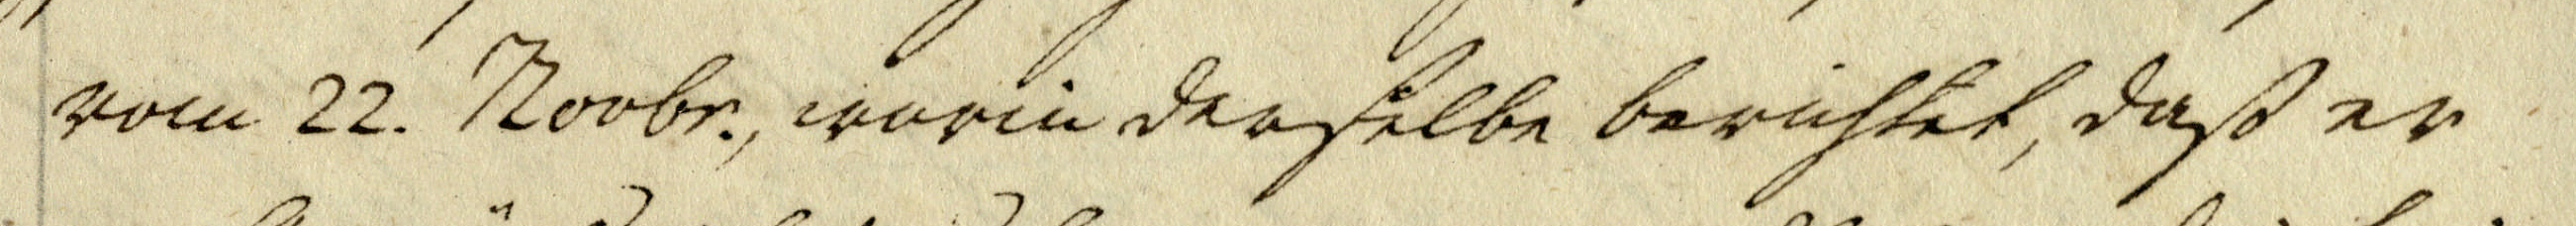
vom 22. Novbr., worin derselbe berichtet, daß er
